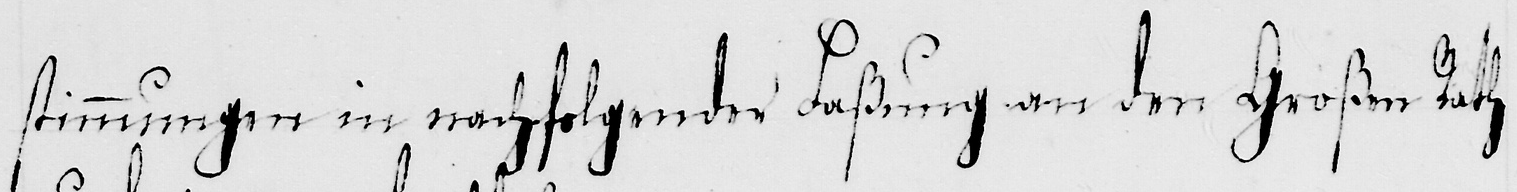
stimmungen in nachfolgender Faßung an den Großen Rath
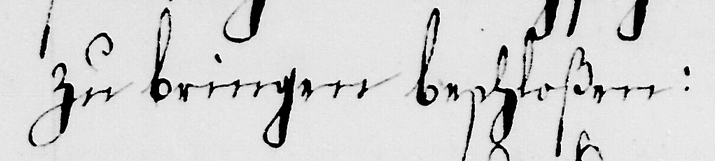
zu bringen beschloßen:
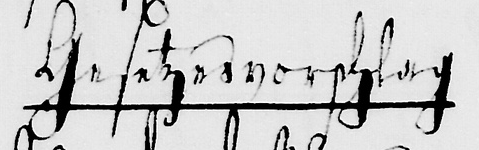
Gesetzesvorschlag
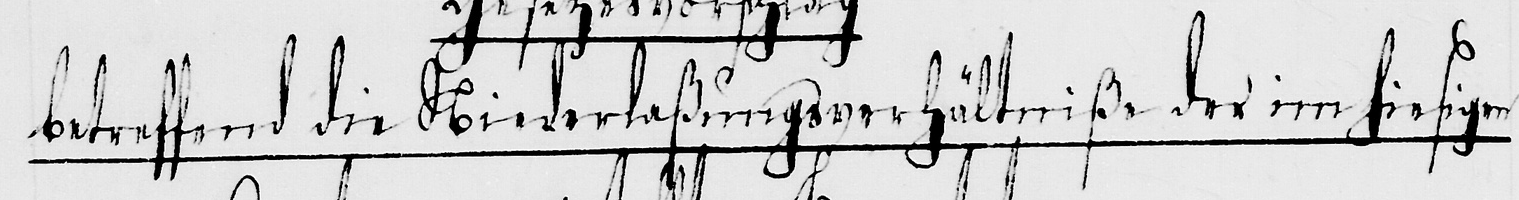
betreffend die Niederlaßungsverhältniße der im hiesig¬
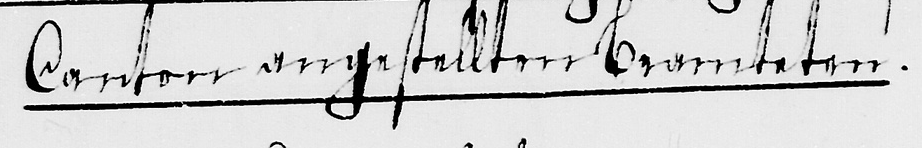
Canton angestellten Beamteten.
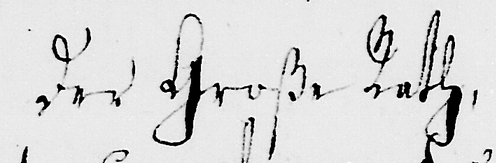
Der Große Rath,
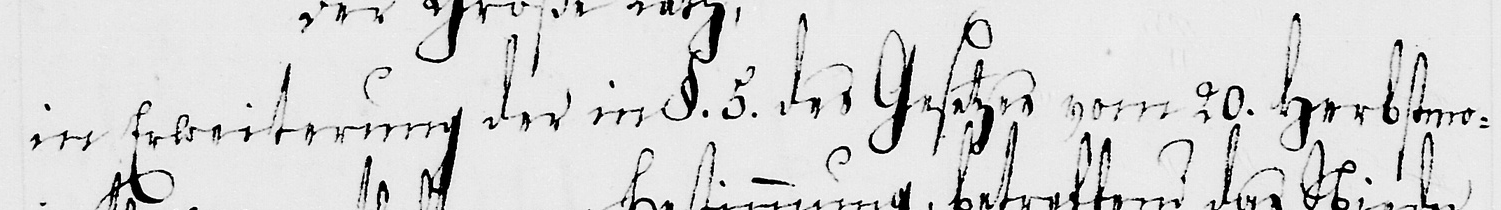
in Erweiterung der in §. 5. des Gesetzes vom 20. Herbstmo¬
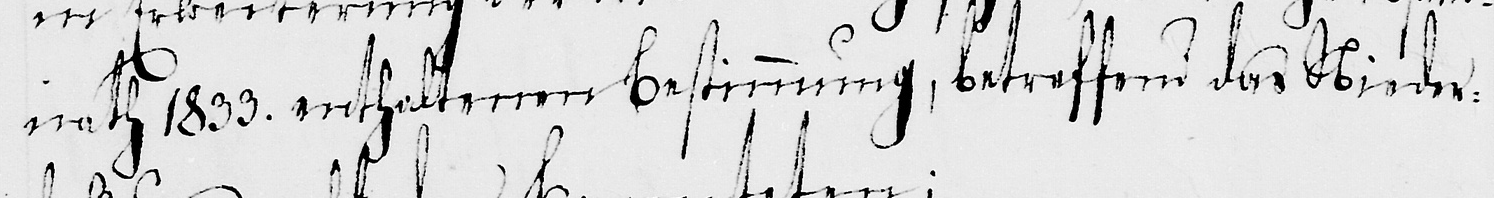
nath 1833. enthaltenen Bestimmung, betreffend das Nieder¬
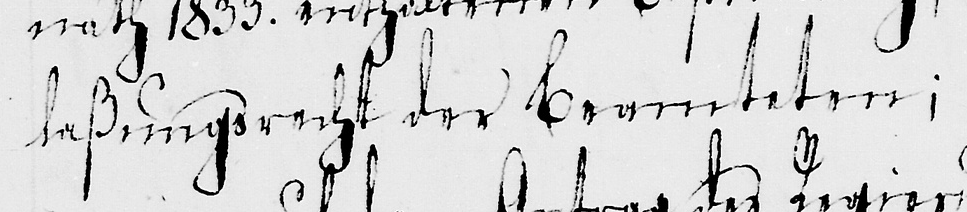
laßungsrecht der Beamteten;
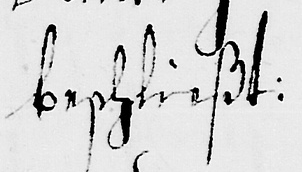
beschließt:
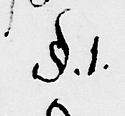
§. 1.
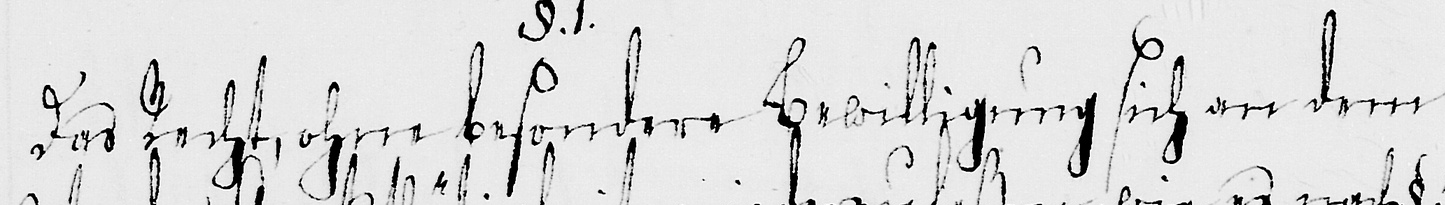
Das Recht, ohne besondere Bewilligung sich an dem
